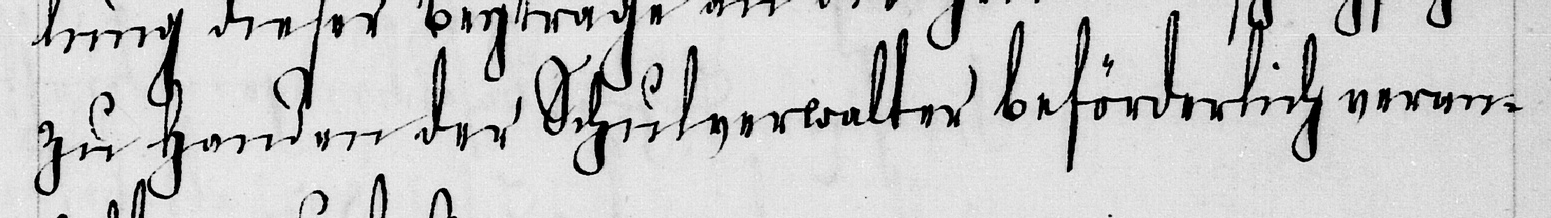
zu Handen der Schulverwalter beförderlich veran¬
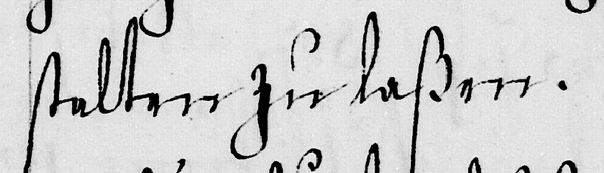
stalten zu laßen.
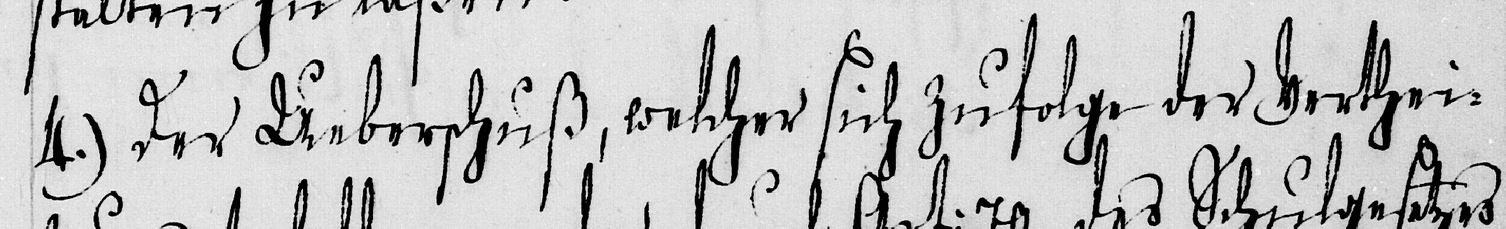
4.) Der Ueberschuß, welcher sich zu folge der Verthei¬
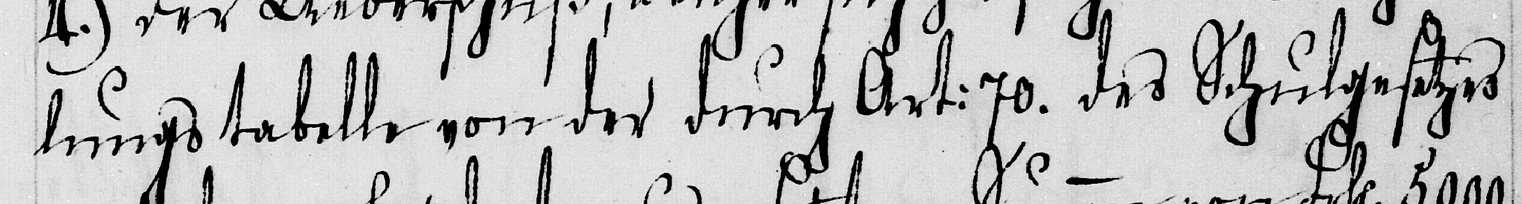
lungstabelle von der durch Art: 70. des Schulgesetzes
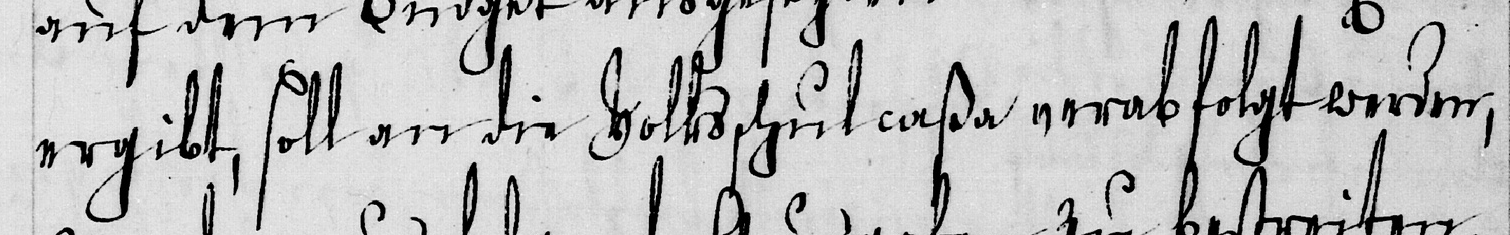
ergibt, soll an die Volksschulcaßa verabfolgt werden,
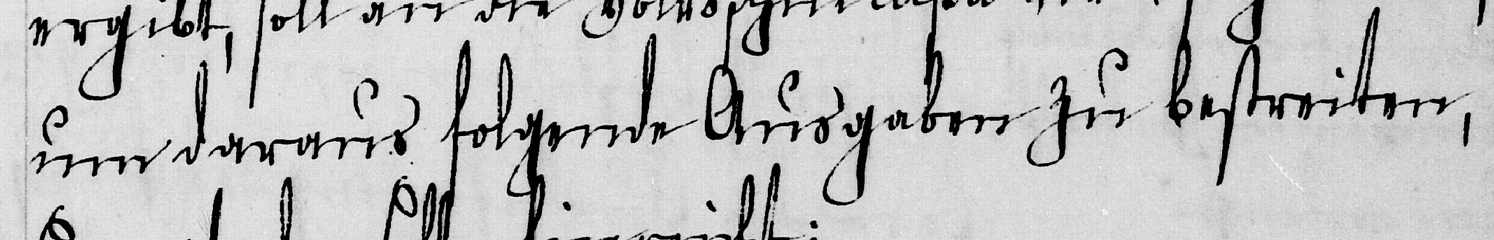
um daraus folgende Ausgaben zu bestreiten,
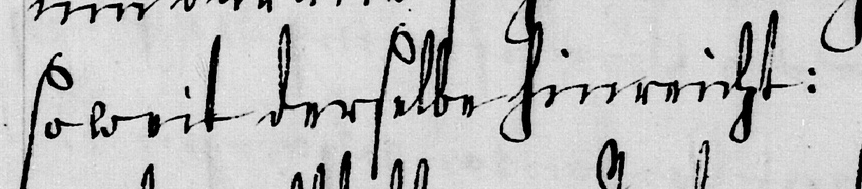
soweit derselbe hinreicht:
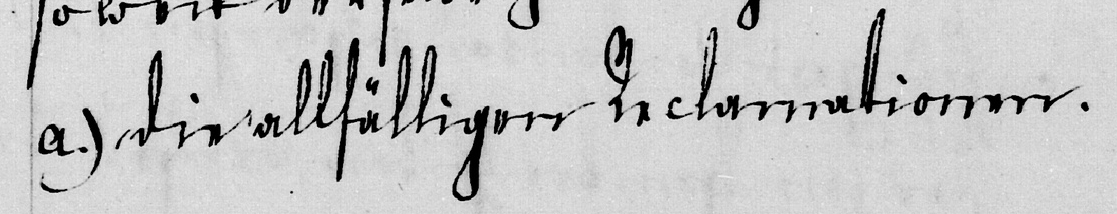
a.) die allfälligen Reclamationen.
